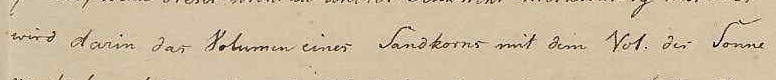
wird darin das Volumen eines Sandkorns mit dem Vol. der Sonne
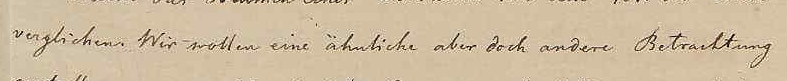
verglichen. Wir wollen eine ähnliche aber doch andere Betrachtung
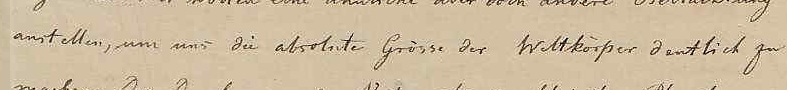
anstellen, um uns die absolute Grösse der Weltkörper deutlich zu
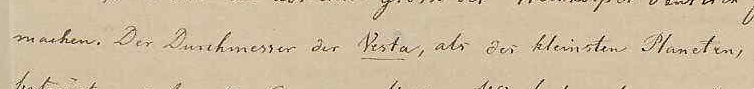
machen. Der Durchmesser der Vesta, als des kleinsten Planeten,
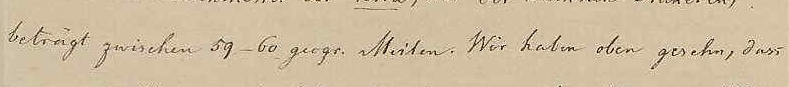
beträgt zwischen 59–60 geogr. Meilen. Wir haben oben gesehn, dass
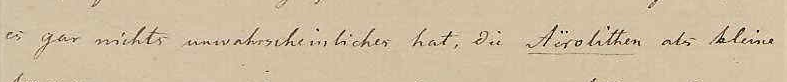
es gar nichts unwahrscheinliches hat, die Aërolithen als kleine
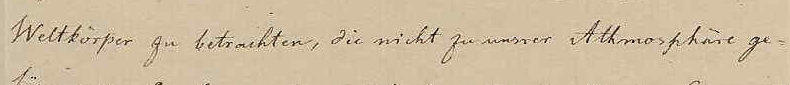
Weltkörper zu betrachten, die nicht zu unsrer Athmosphäre ge-
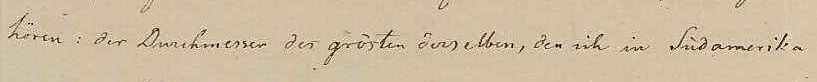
hören: der Durchmesser des grösten derselben, den ich in Südamerika
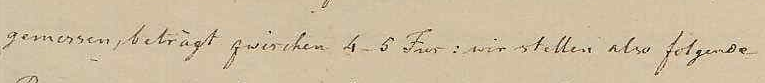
gemessen, beträgt zwischen 4–5 Fus: wir stellen also folgende
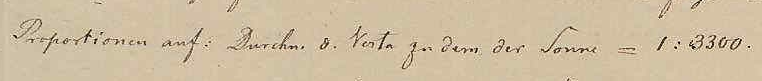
Proportionen auf: Durchm. d. Vesta zu dem der Sonne 1:3300.
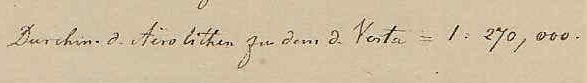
Durchm. d. Aërolithen zu dem d. Vesta 1:270,000.
